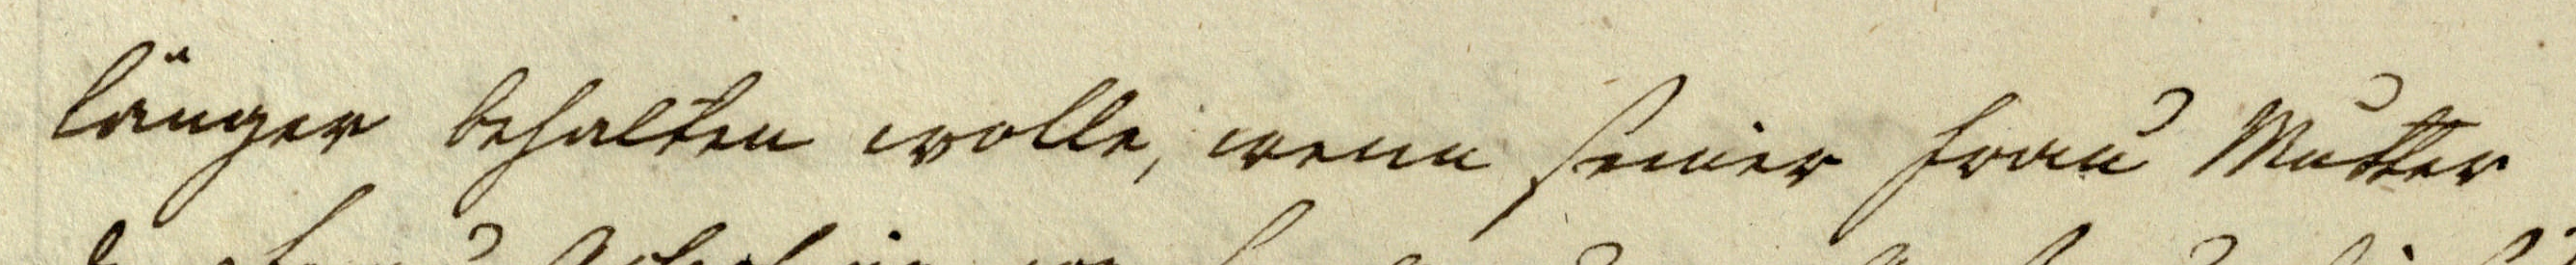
länger behalten wolle, wenn seiner Frau Mutter
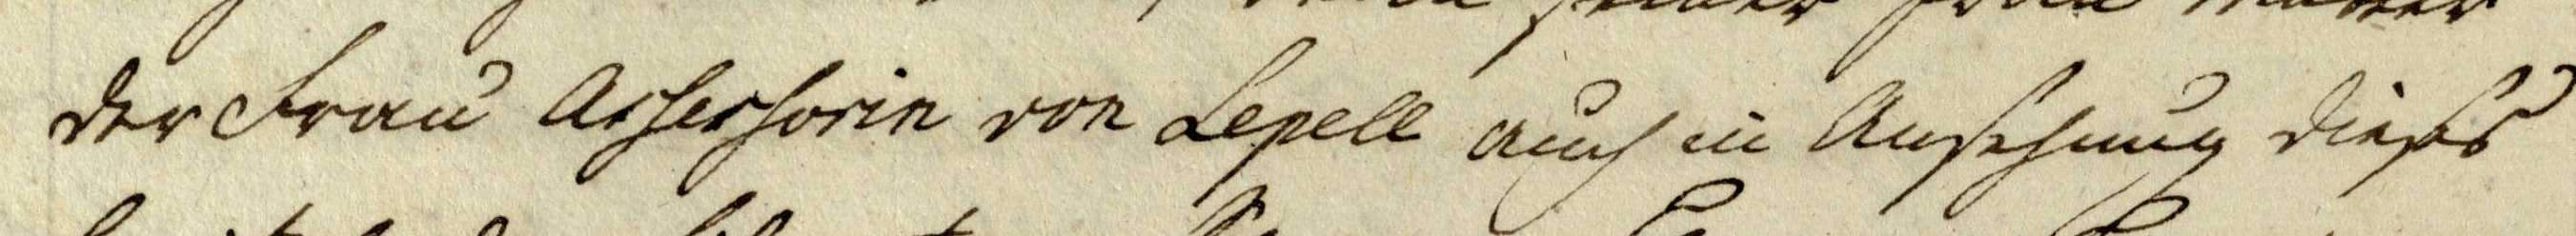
der Frau Assessorin von Lepell auch in Ansehung dieses
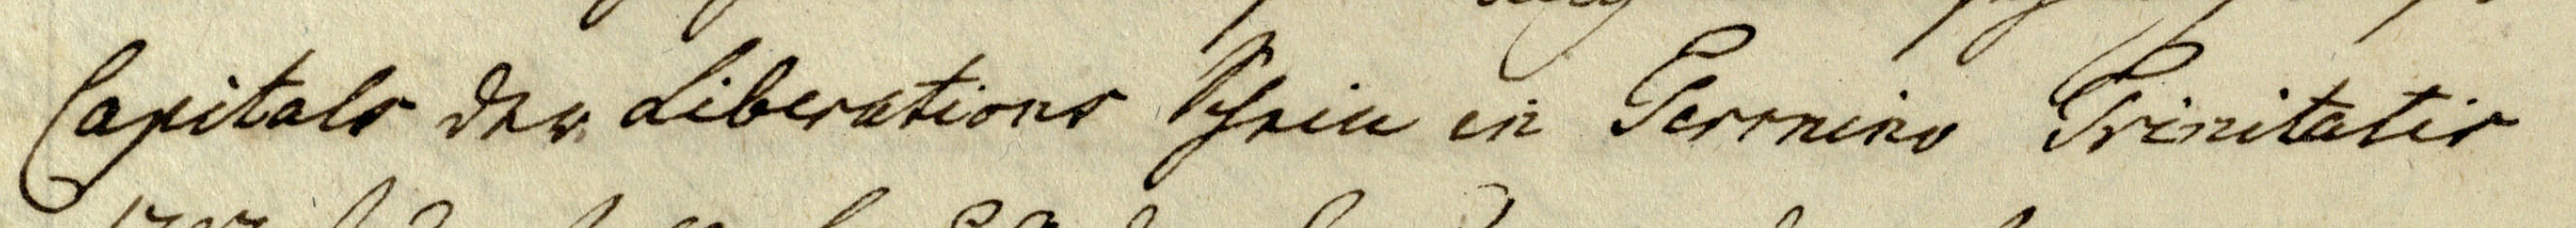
Capitals der Liberatioas Schein in Termino Trinitatis
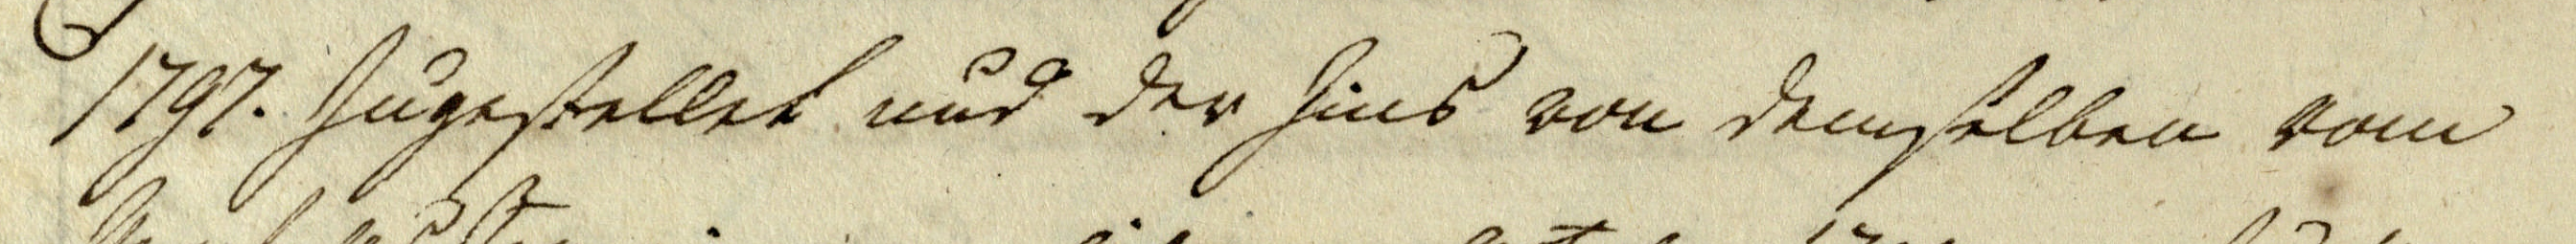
1797. zugestellet und der Zins von demselben vom
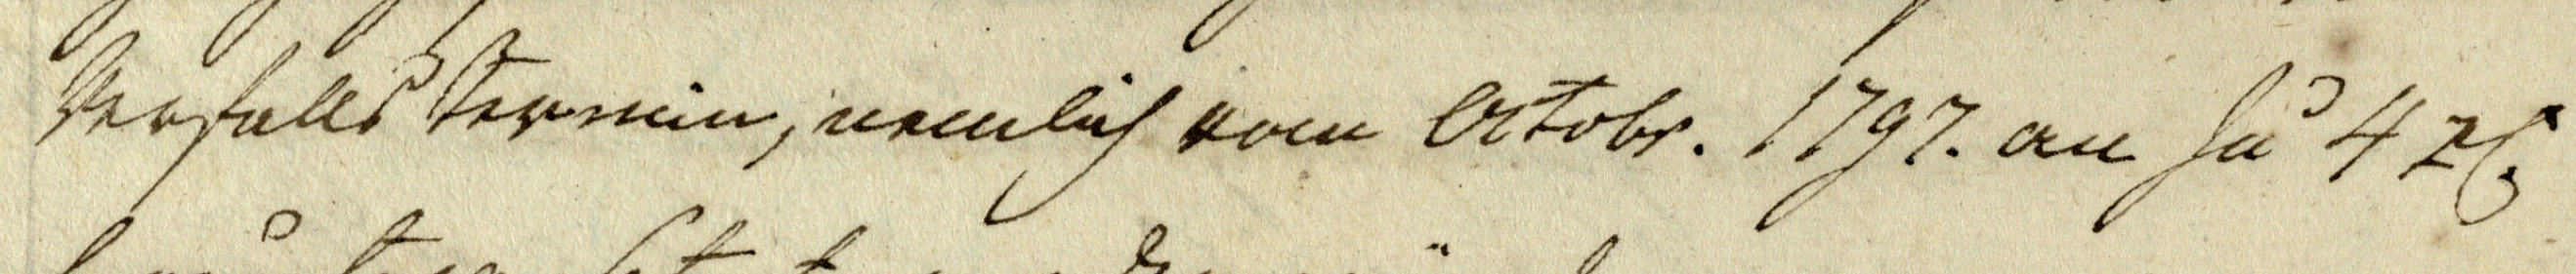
Verfalls Termin, nemlich vom Octobr. 1797. an zu 4 pl.
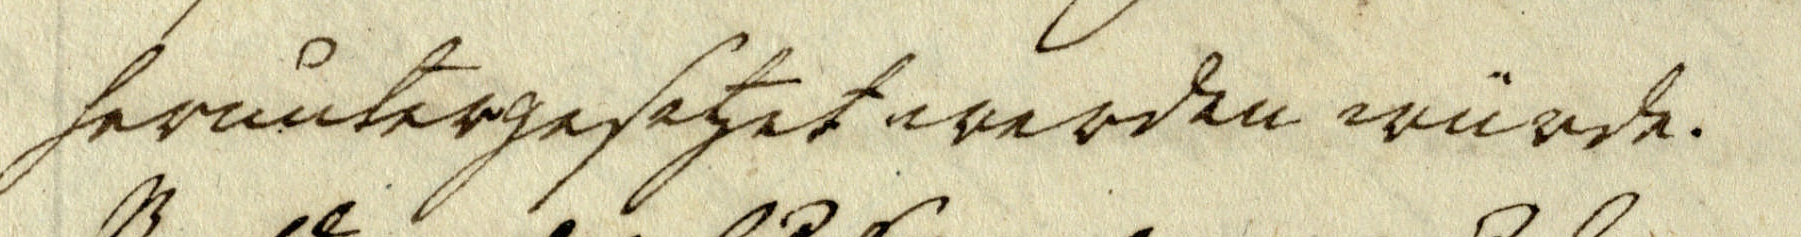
heruntergesetzet werden würde.
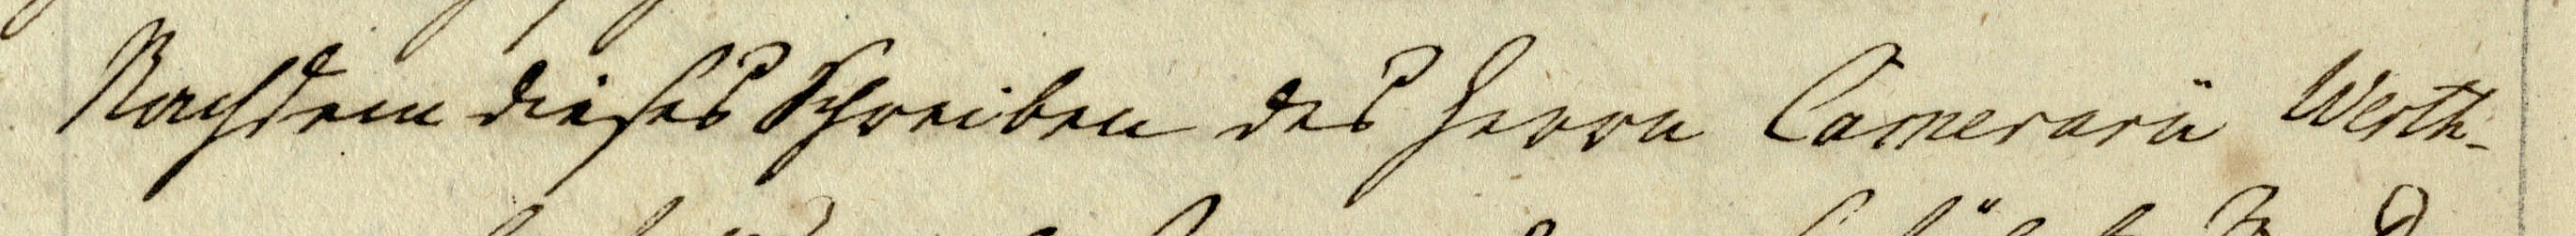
Nachdem dieses Schreiben des Herrn Camerarii Werth¬
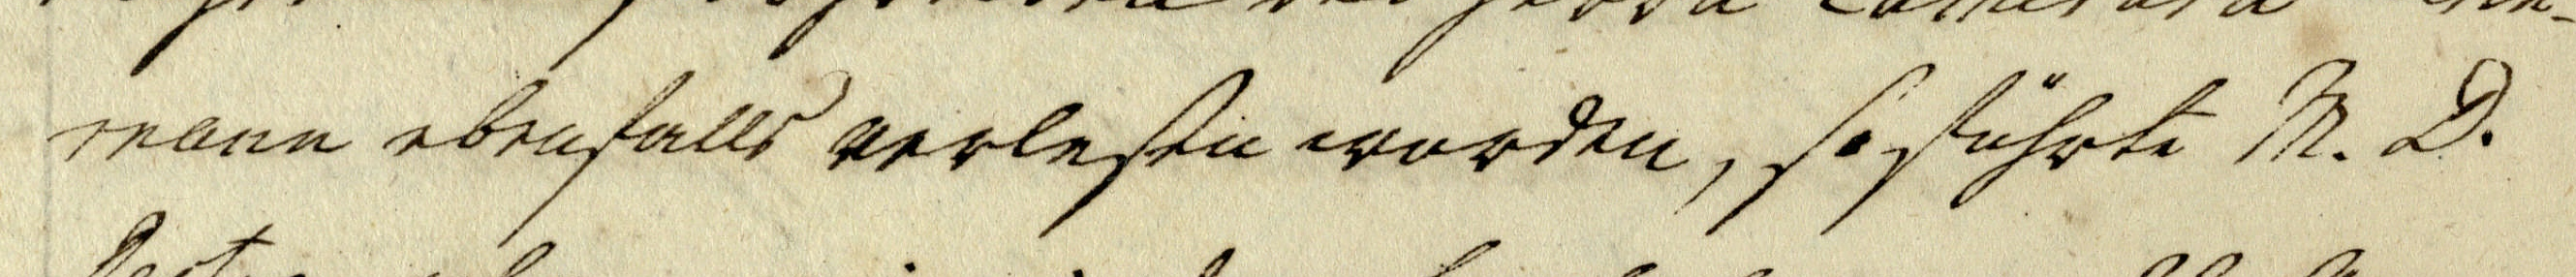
mann ebenfalls verlesen worden, so führte M. D.
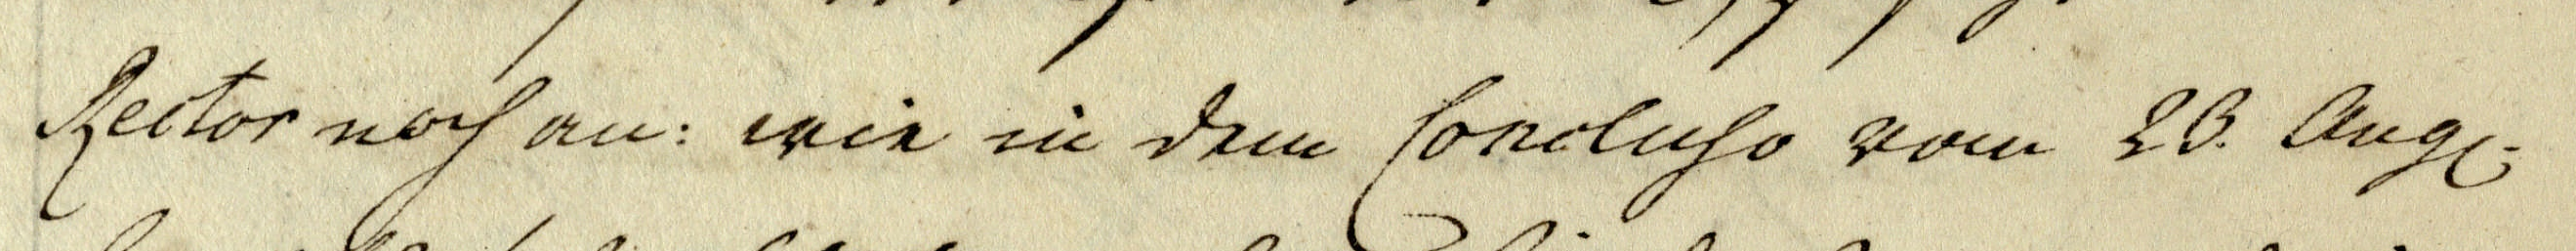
Rector noch an: wie in dem Concluso vom 23 Aug.
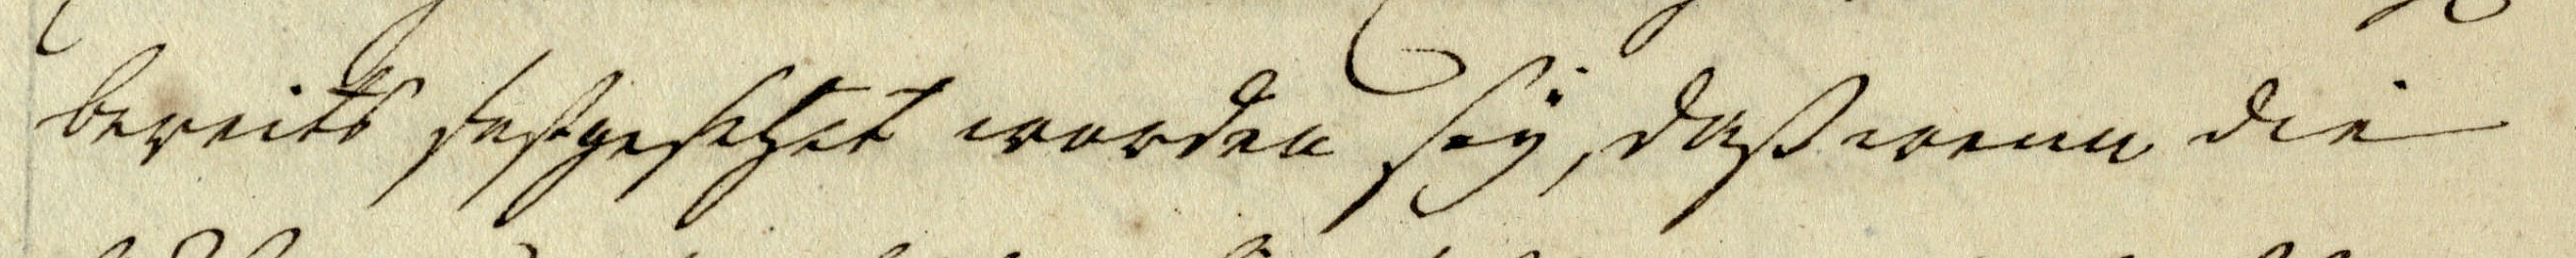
bereits festgesetzet worden seÿ, daß wenn die
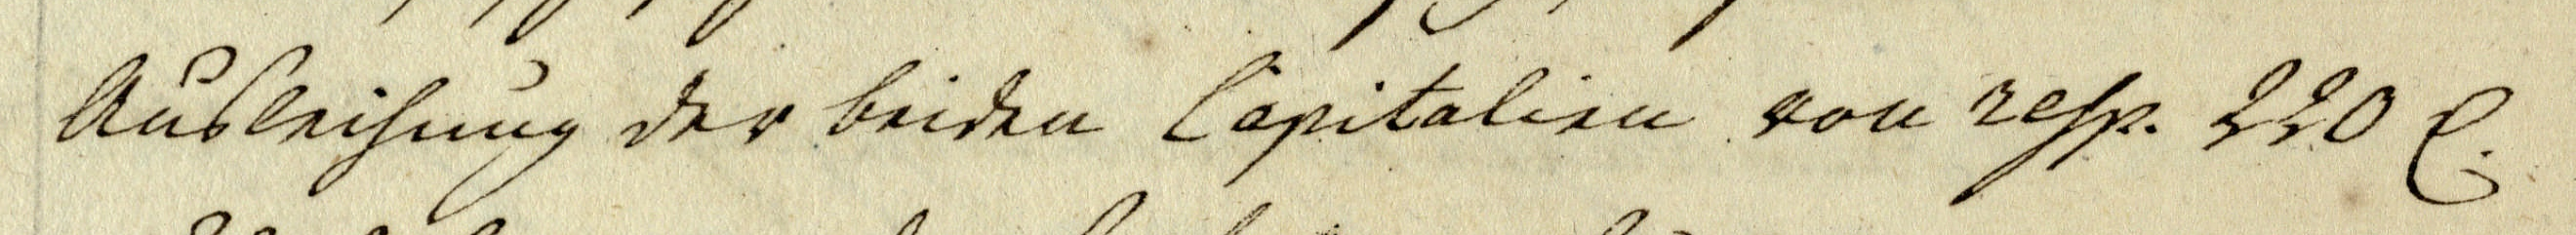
Ausleihung der beiden Capitalien von resp. 220 l.
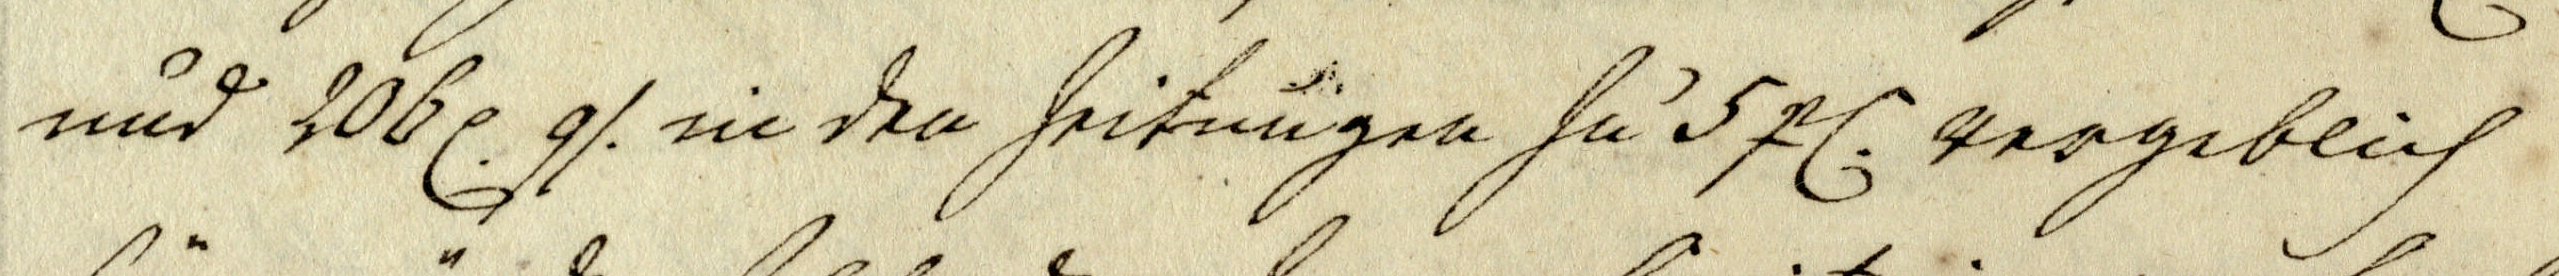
und 206 l. 9 s. in den Zeitungen zu 5 pl. vergeblich
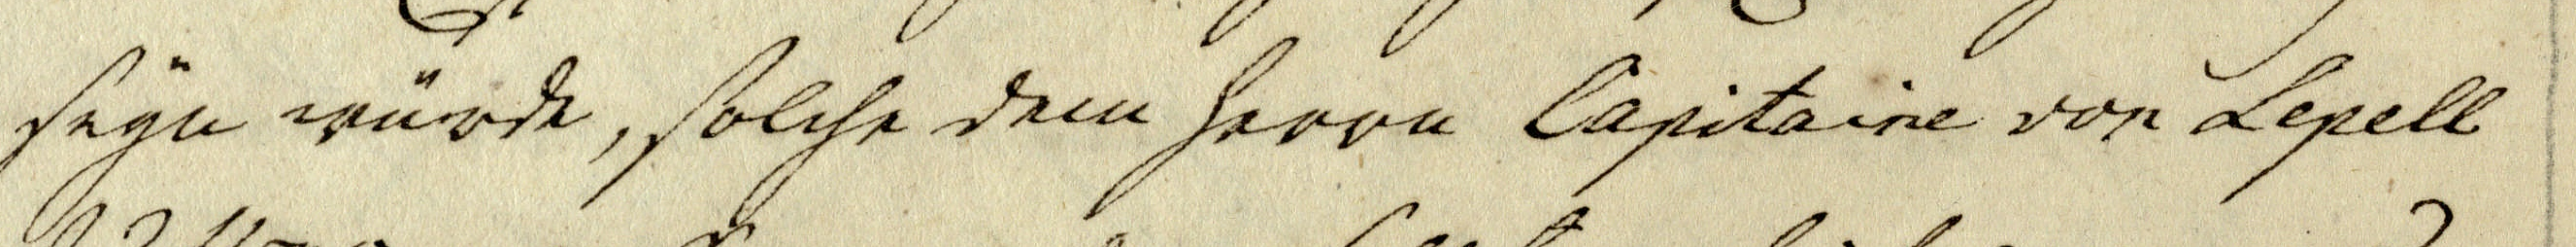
seÿn würde, solche dem Herrn Capctaine von Lepell
